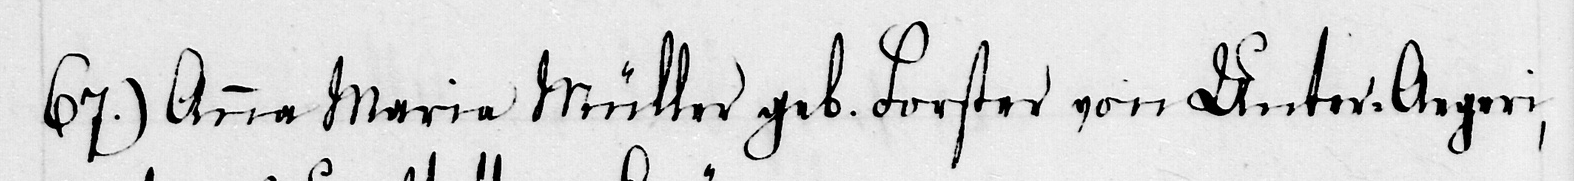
67.) Anna Maria Müller geb. Forster von Unter-Aegeri,
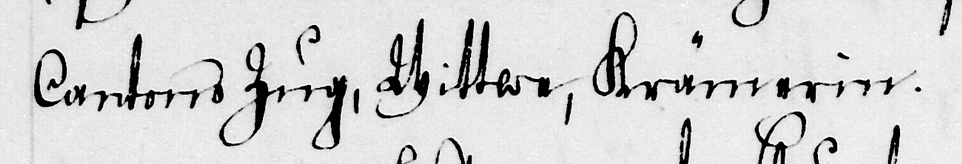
Cantons Zug, Wittwe, Krämerin.
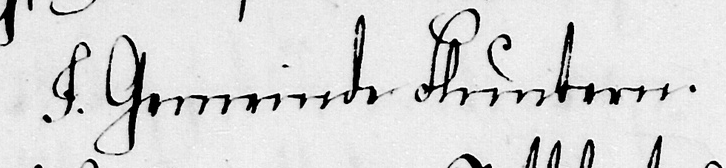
F. Gemeinde Fluntern.
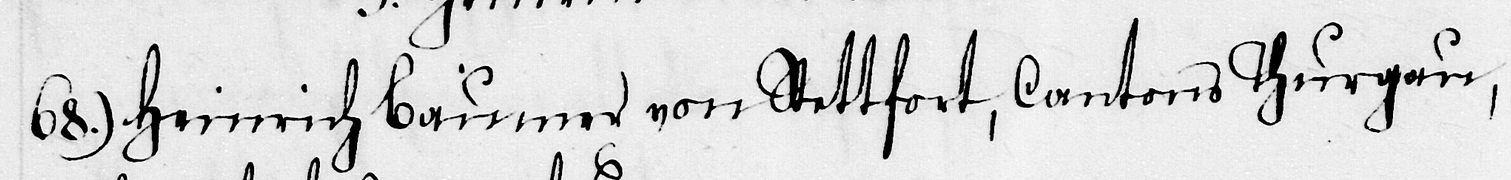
68.) Heinrich Baumer von Stettfort, Cantons Thurgau,
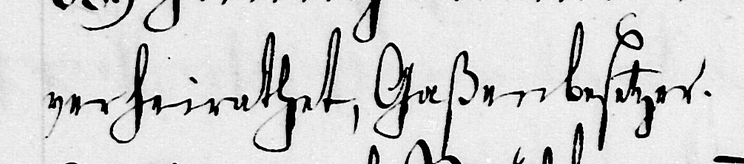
verheirathet, Gaßenbesetzer.
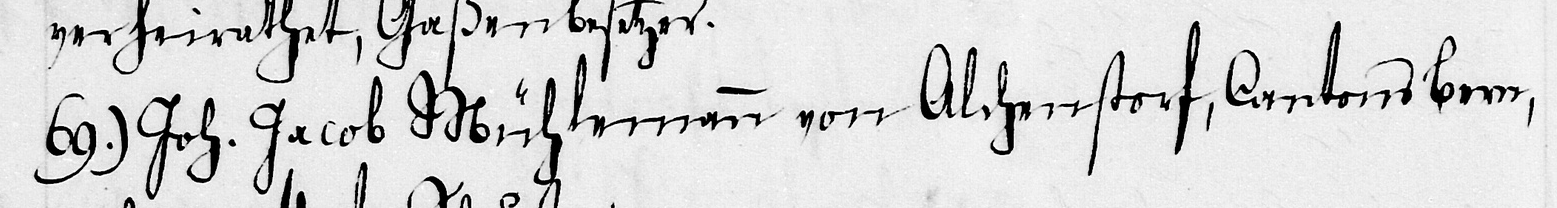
69.) Joh. Jacob Mühlemann von Alchenstorf, Cantons Bern,
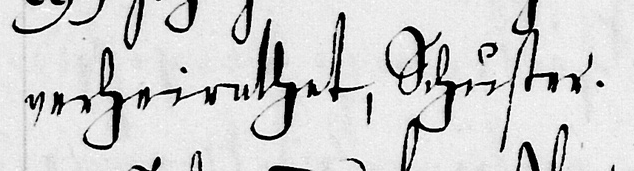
verheirathet, Schuster.
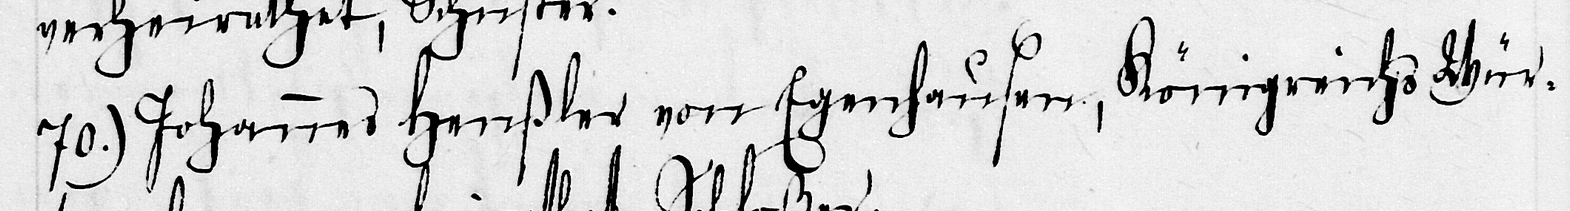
70.) Johannes Henßler von Egenhausen, Königreichs Wür¬
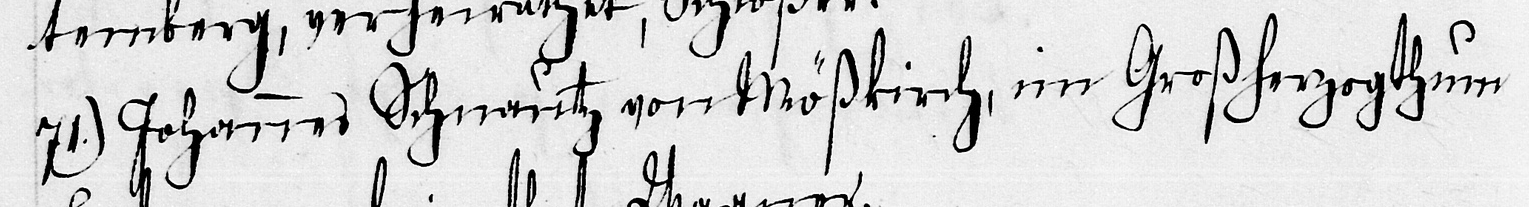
71.) Johannes Schnautz von Mößkirch, im Großherzogthum
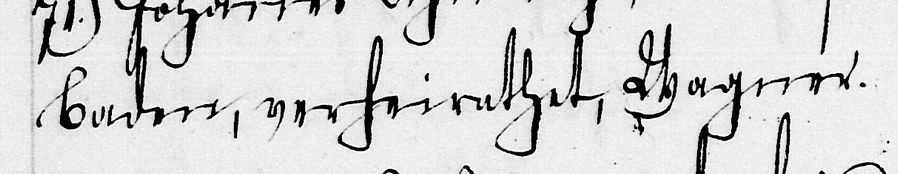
Baden, verheirathet, Wagner.
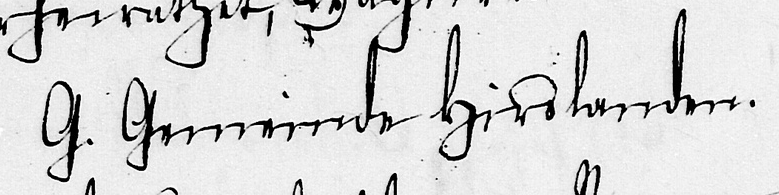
G. Gemeinde Hirslanden.
